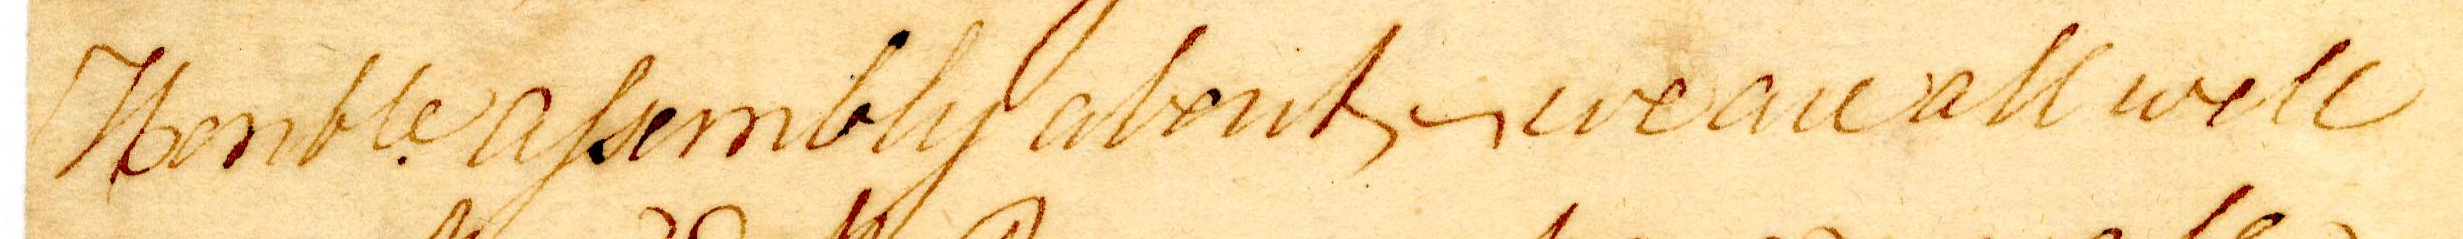Honble. Assembly about- we are all well
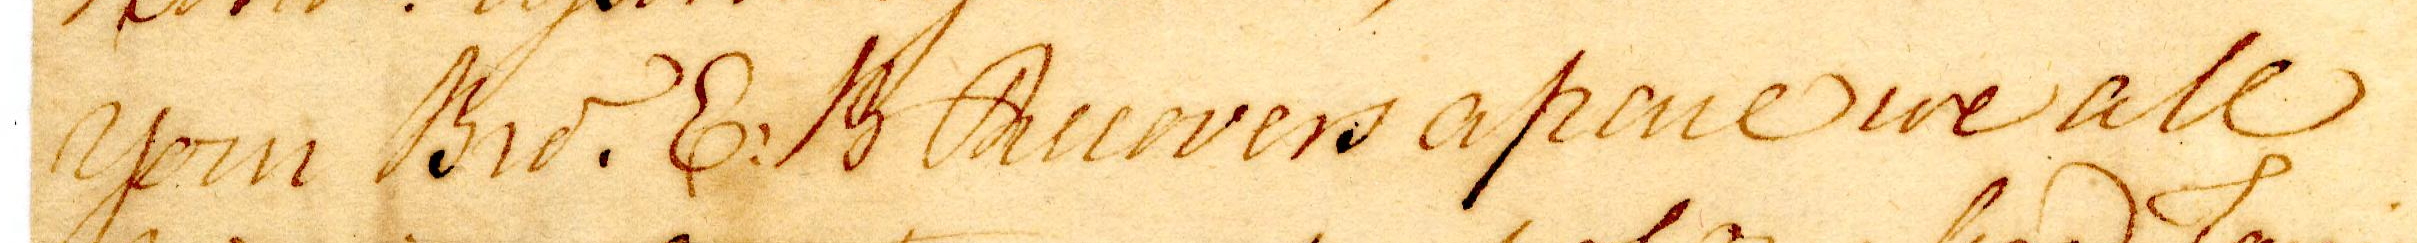your Bro. E: B Recovers as are we all
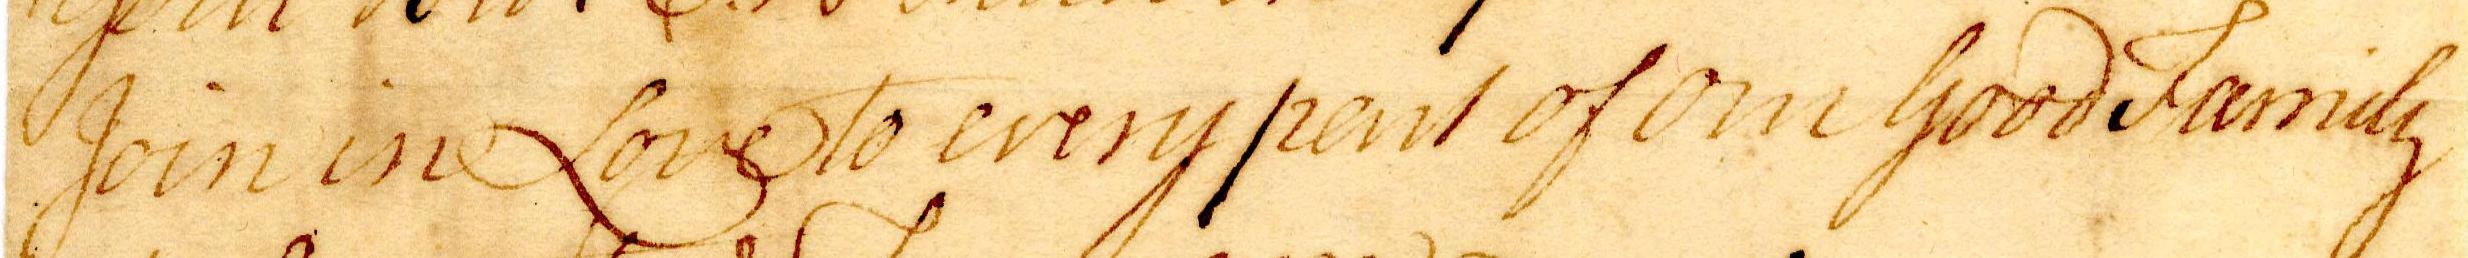Join in Love to every part of our Good Family
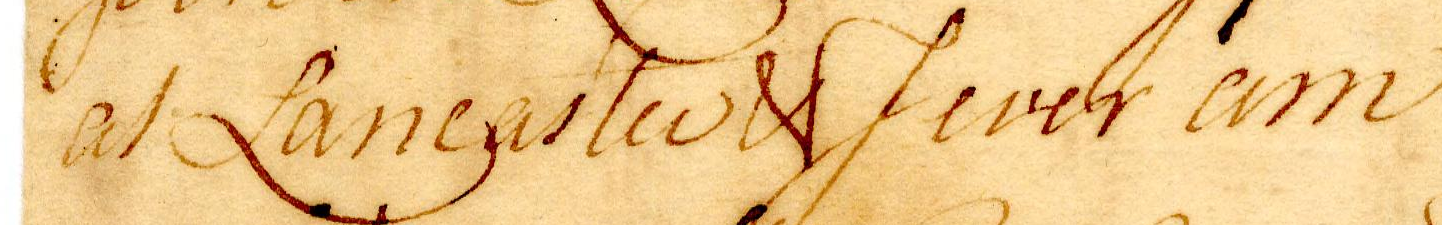at Lancaster & I ever am
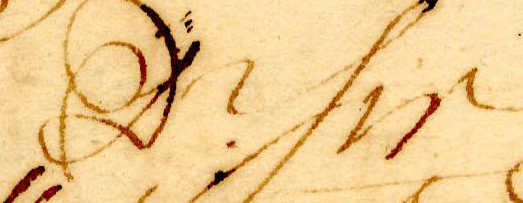Dr Sir
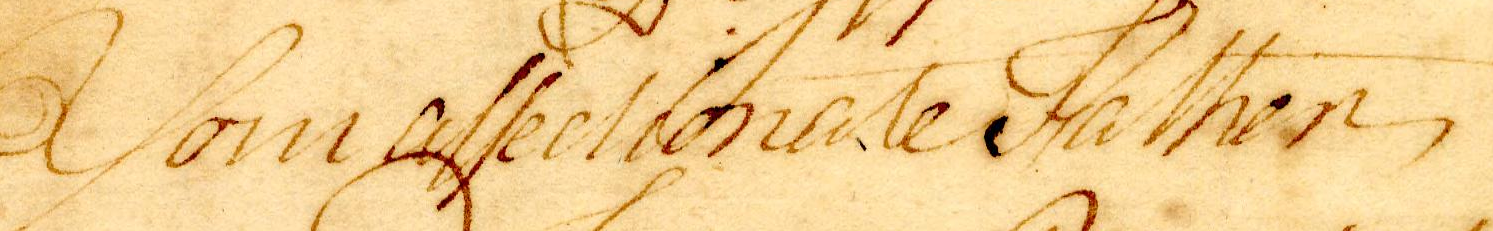You affectionate Father
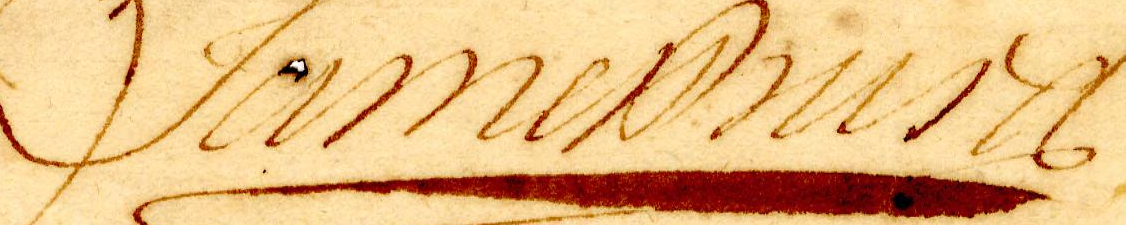James Burd
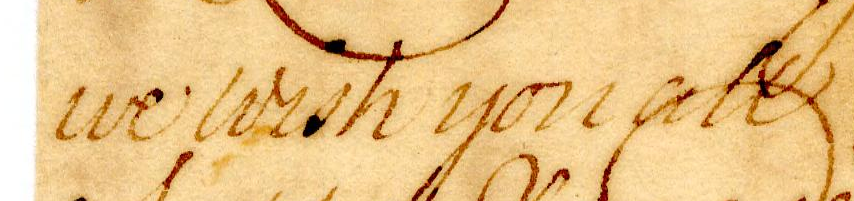we wish you all
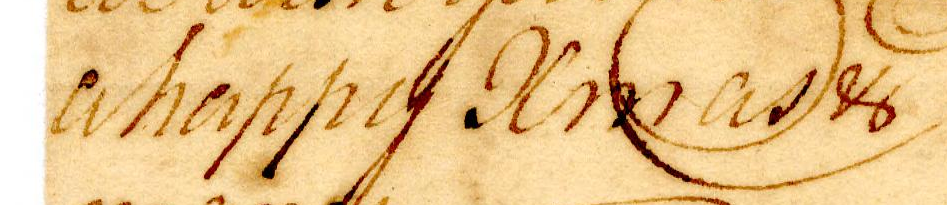a happy Xmas &
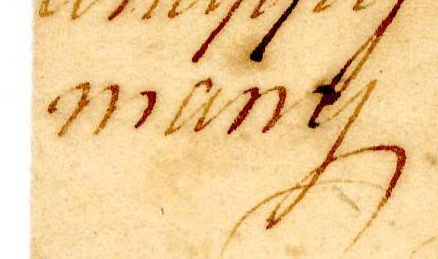many
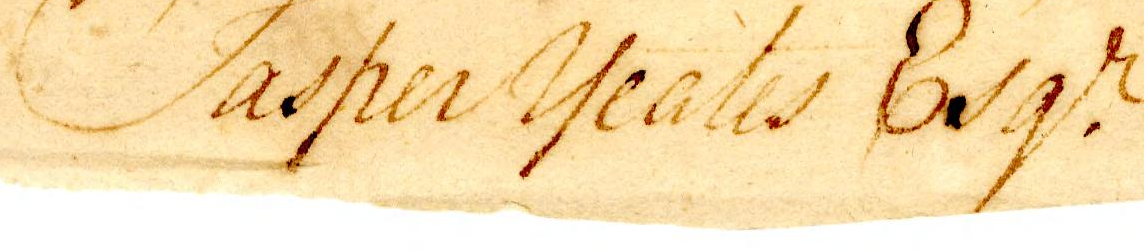Jasper Yeates Esq^r.
